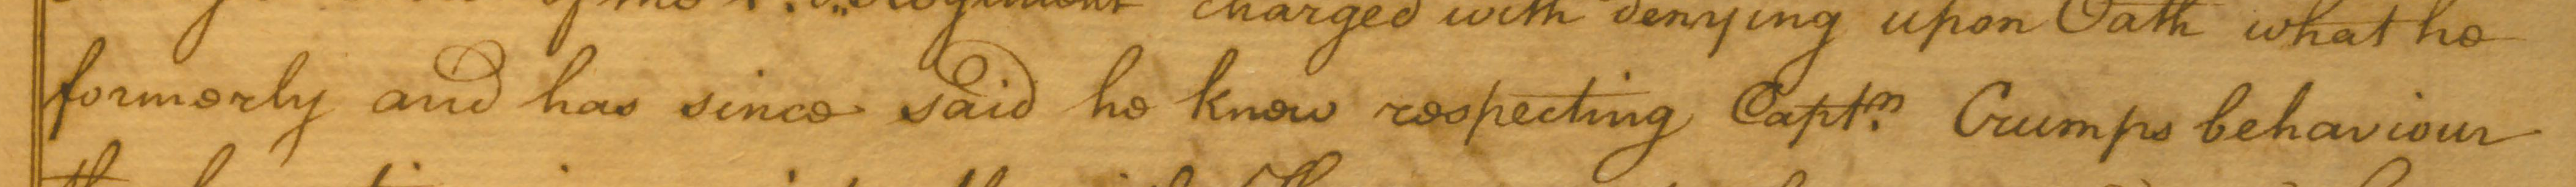formerly and has since said he knew respecting Capt^n. Crumps behaviour
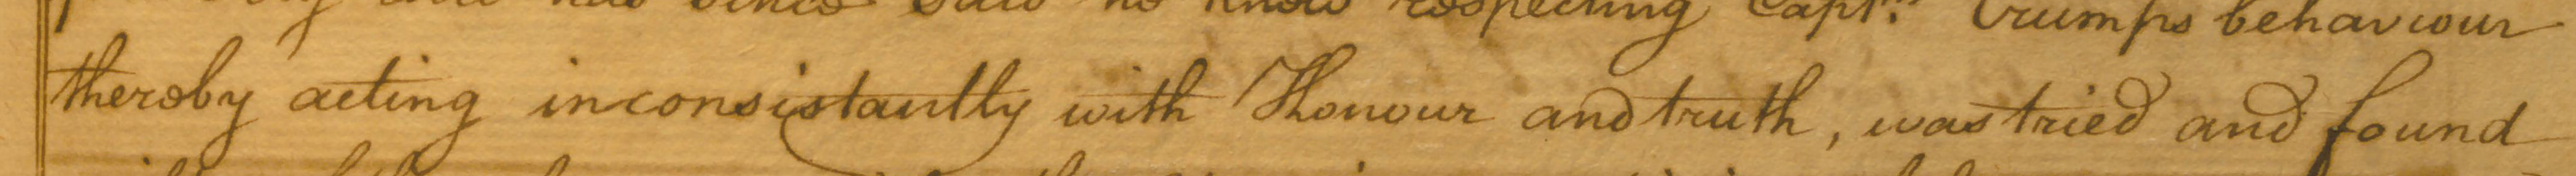thereby acting inconsistently with Honour and truth, was tried and found
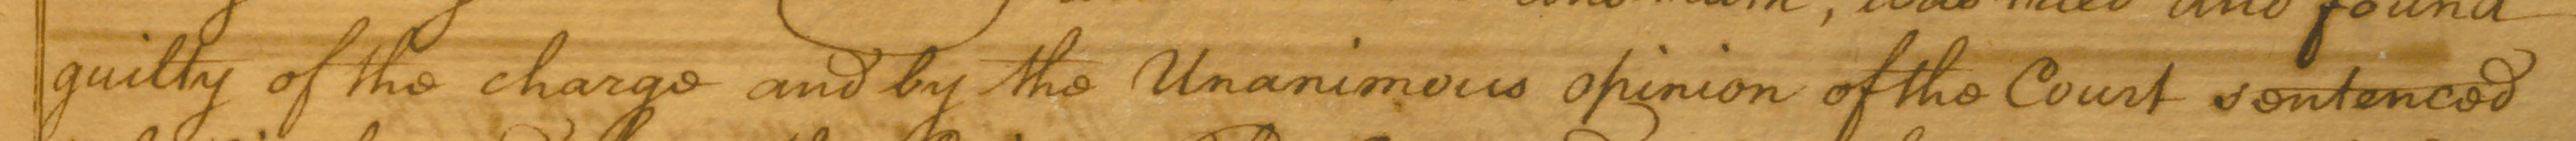guilty of the charge and by the Unanimous opinion of the Court sentenced
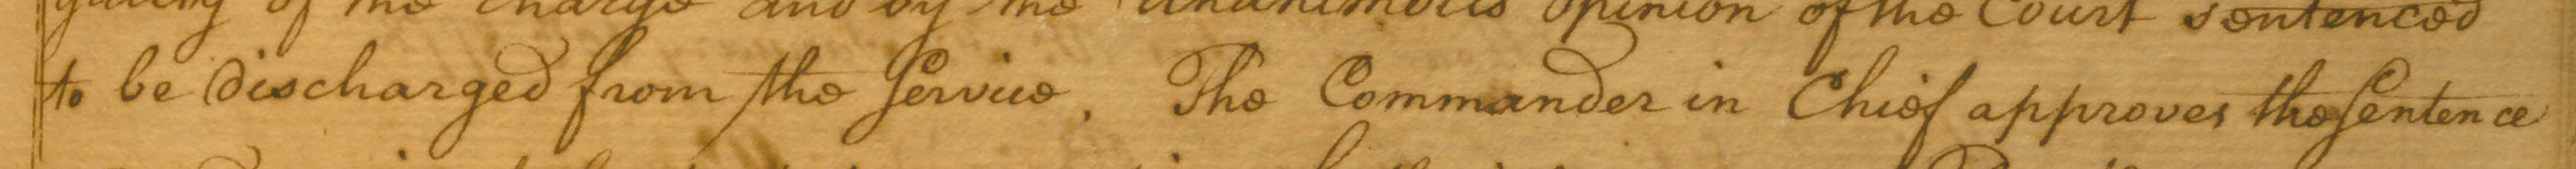to be discharged from the Service. The Commander in Chief approves the sentence
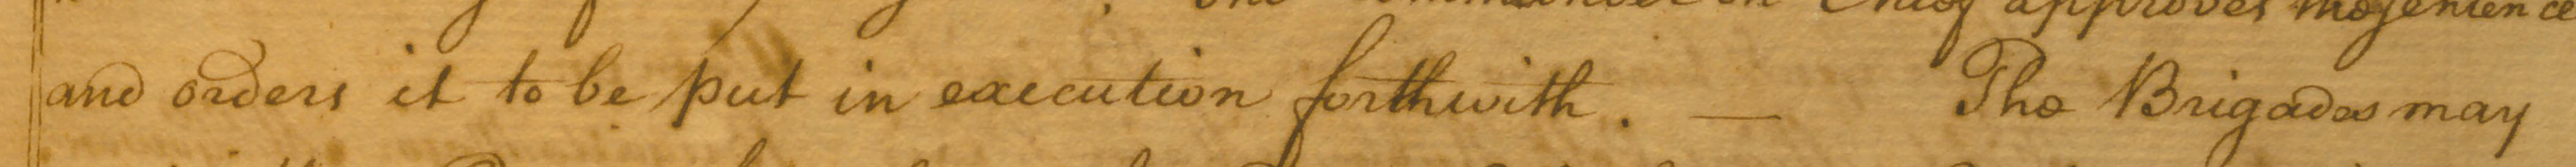and orders it to be put in execution forthwith.- The Brigades may
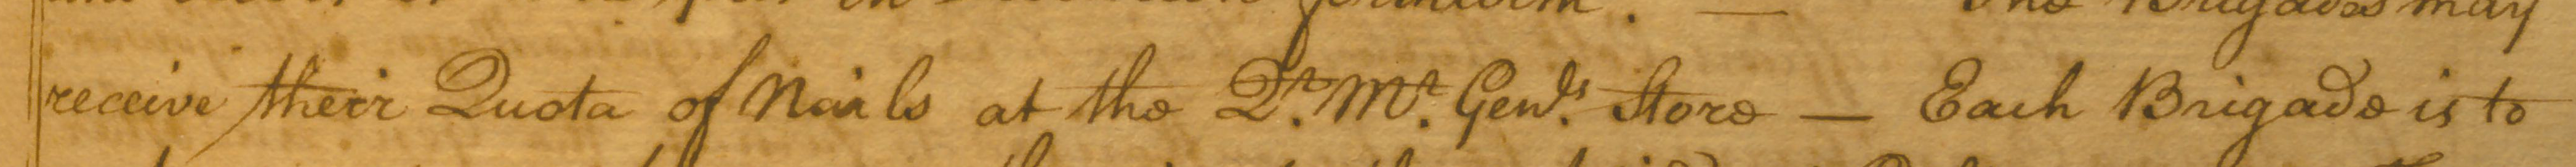receive their Quota of Nails at the Q^r. M^r. Gen^ls. Store- Each Brigade is to
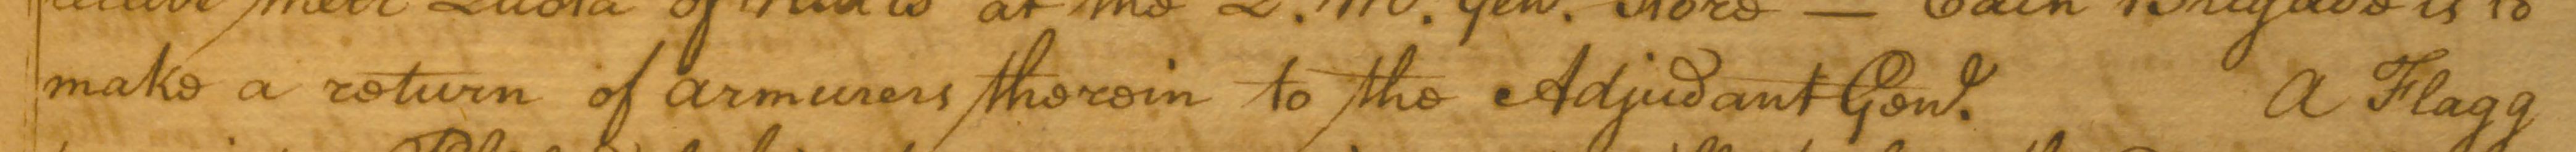make a return of armurers therein to the Adjudant Gen^l. A Flagg
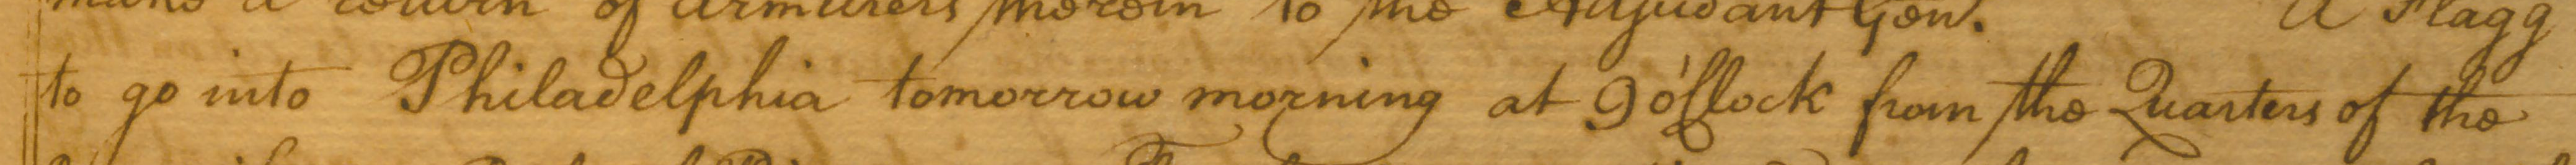to go into Philadelphia tomorrow morning at 9 o'Clock from the Quarters of the
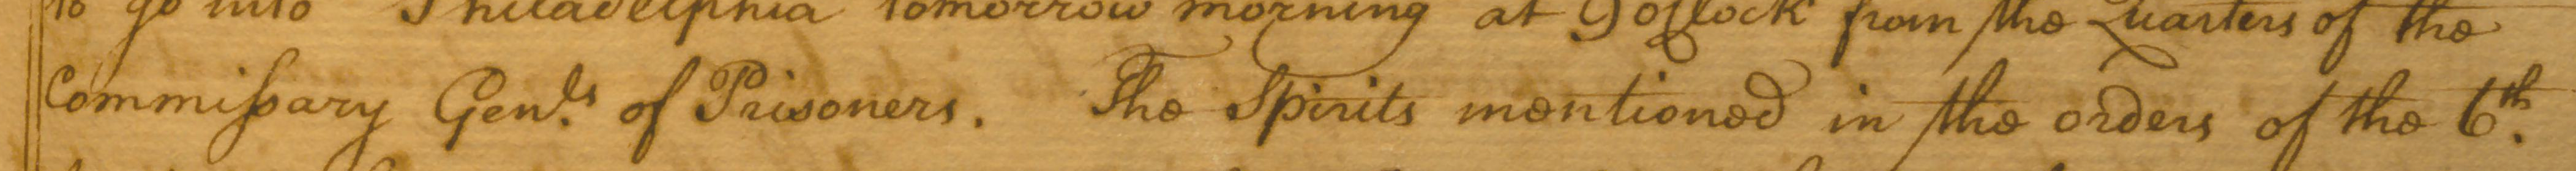Commissary Gen^ls. of Prisoners. The spirits mentioned in the orders of the 6^th.
